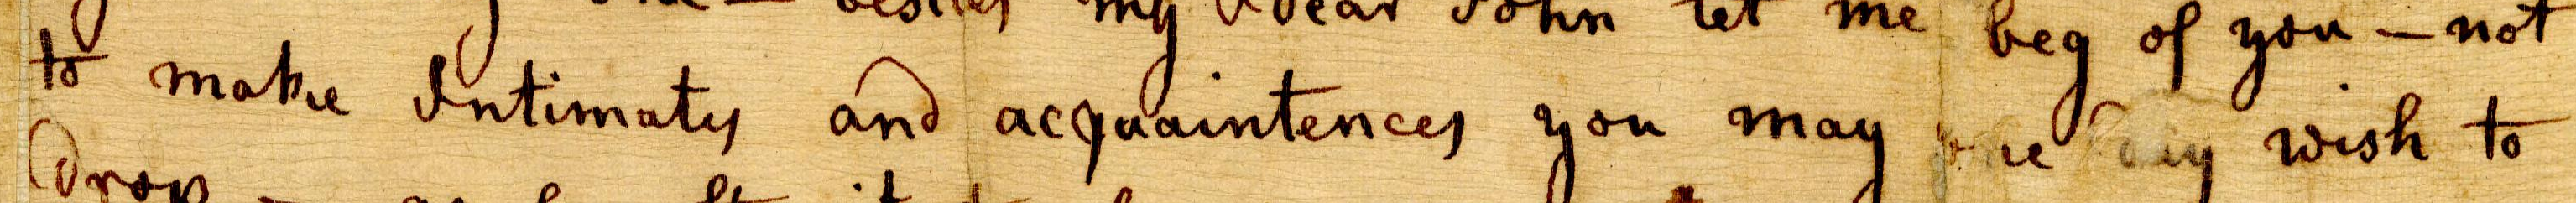to make Intimates and acquaintences you may one day wish to
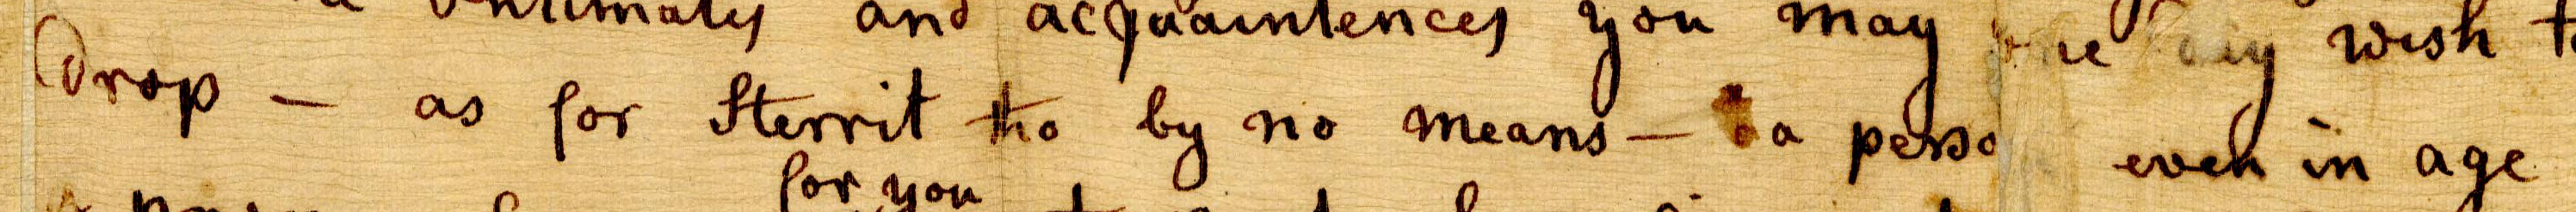drop- as for Sterrit tho by no means- a person even in age
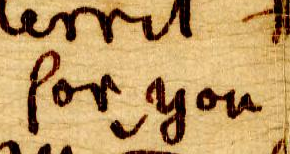for you
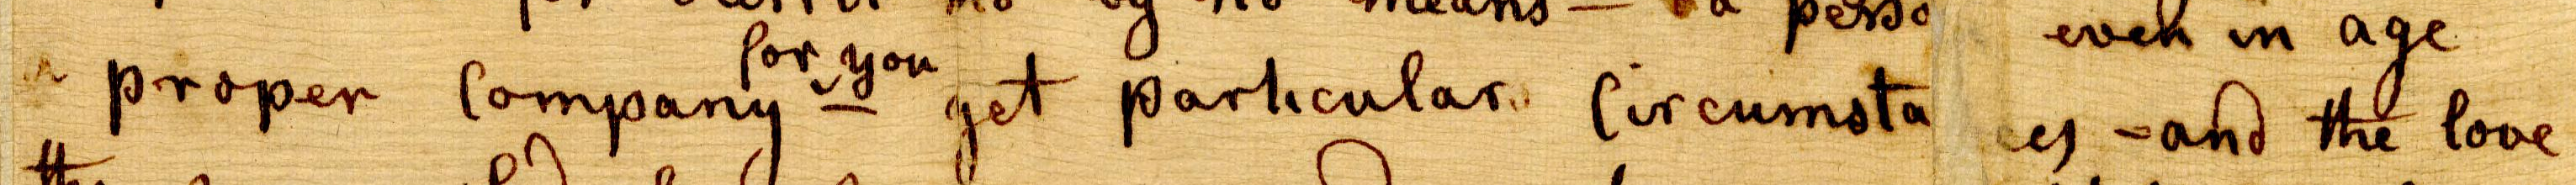[_] proper Company ^ - yet particular Circumsta[_]ces- and the love
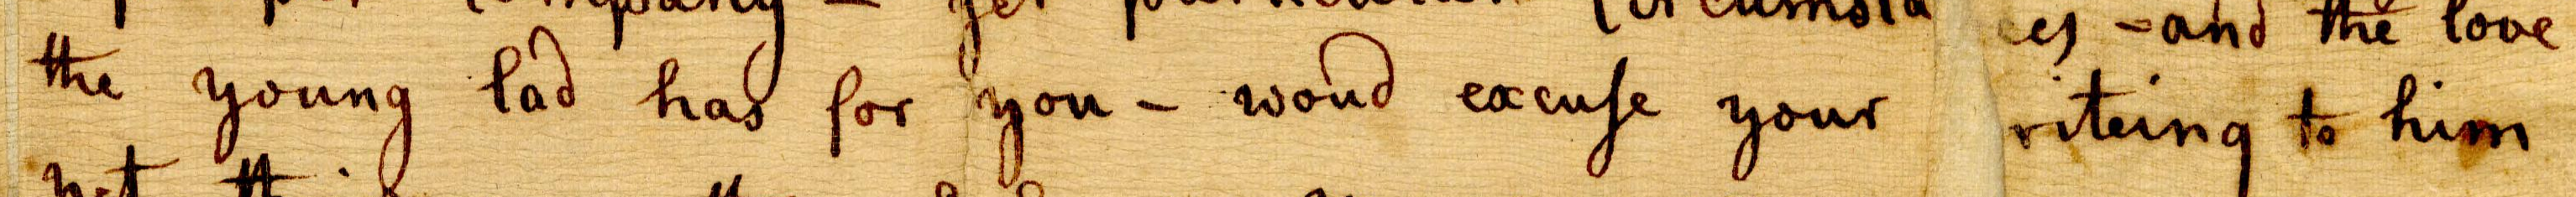the young lad has for you- woud excuse your [_]riteing to him
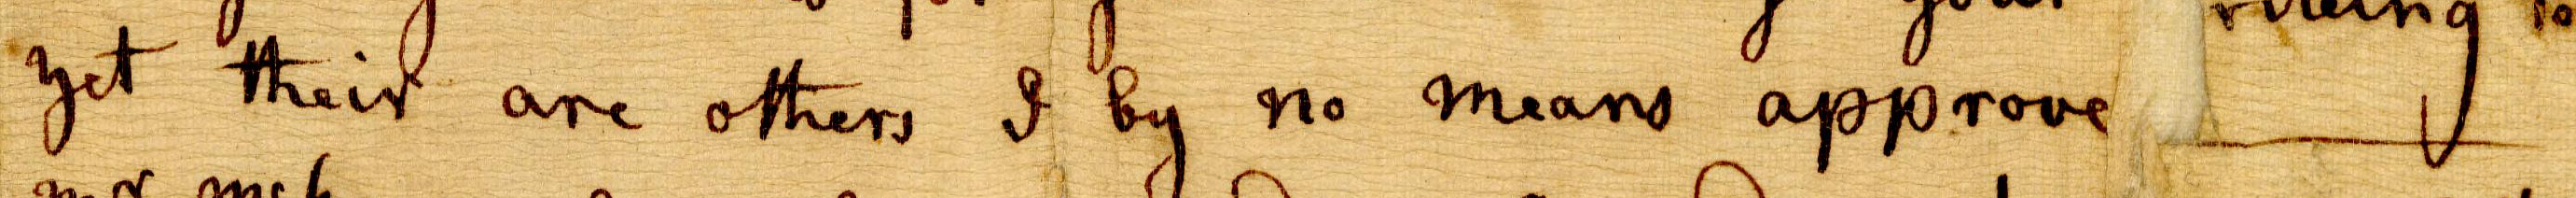yet their are others I by no means approve-
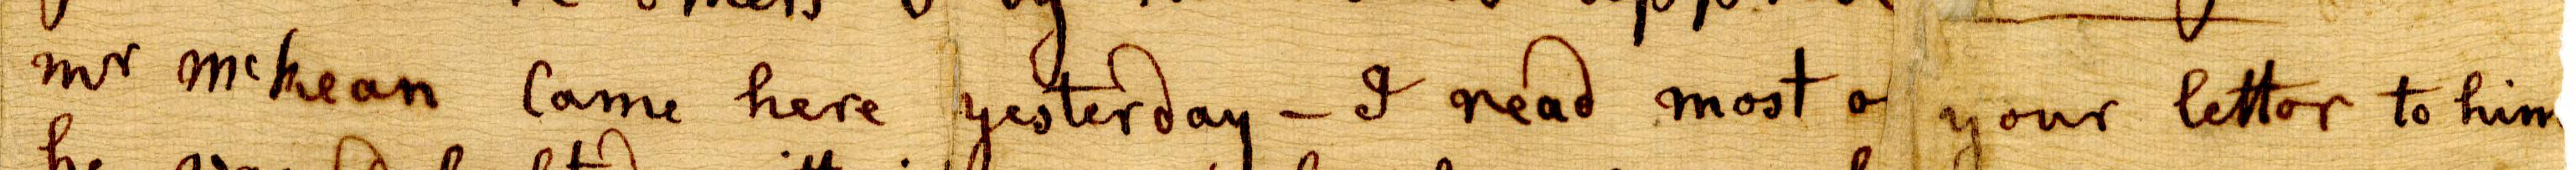M^r M^ckean came here yesterday- I read most a your letter to him
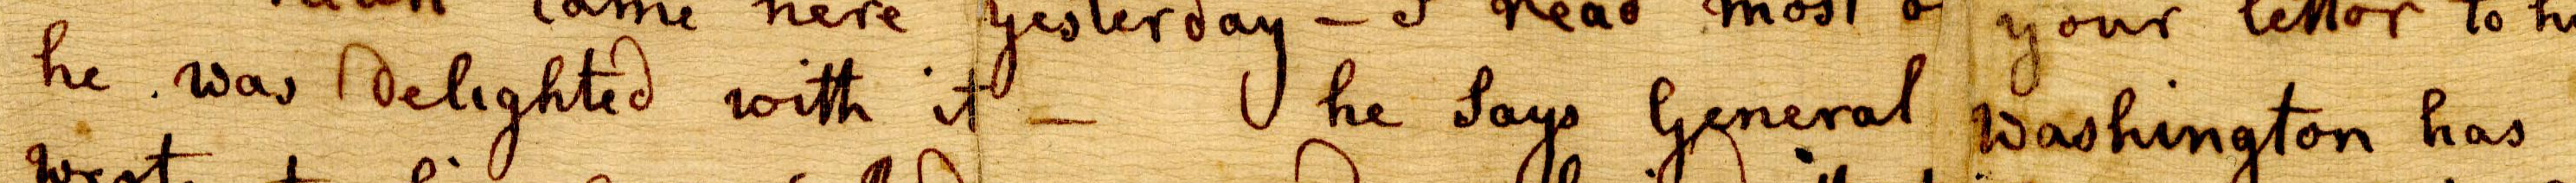he was delighted with it- he says General Washington has
